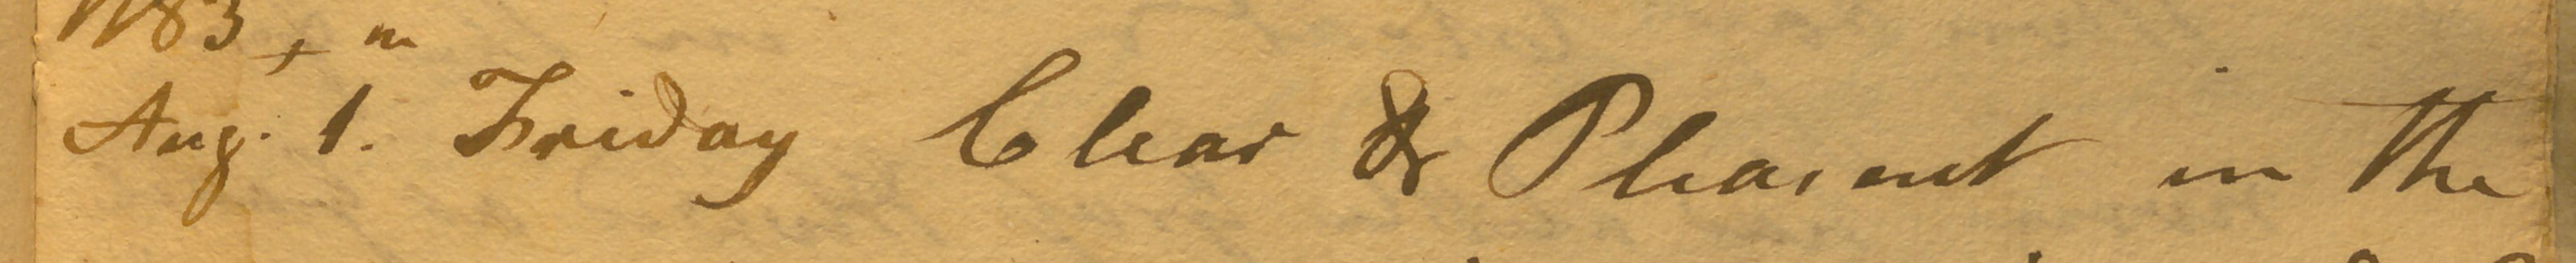Aug^t. 1^th. Friday Clear & Pleasent in the
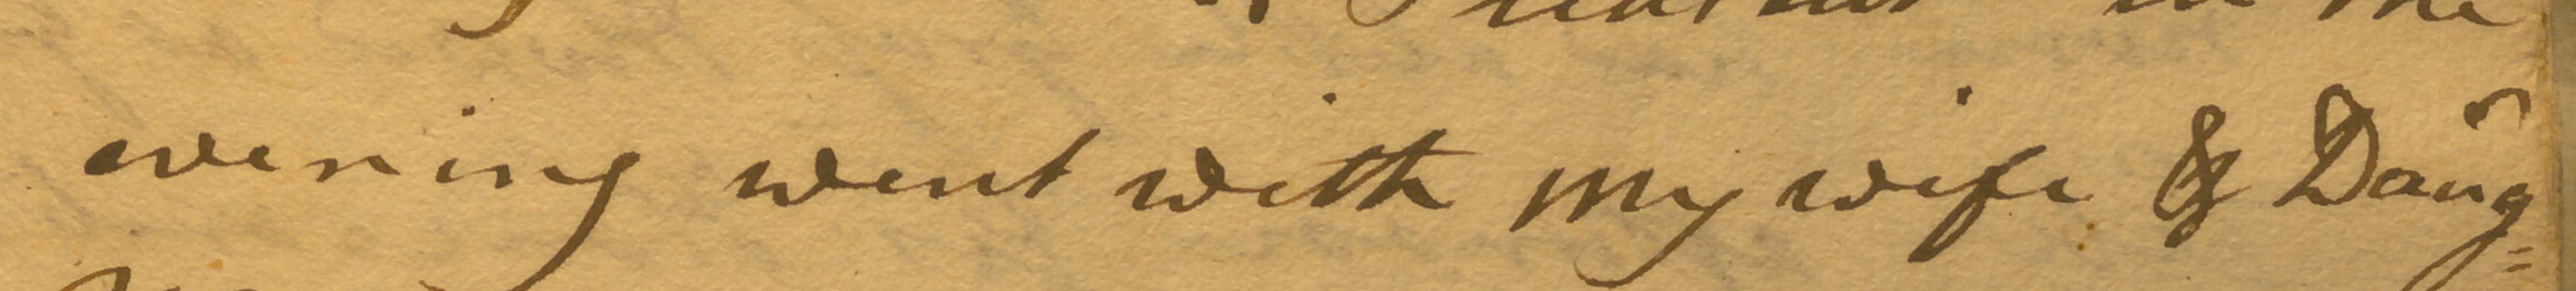evening went with my wife & Daug^r
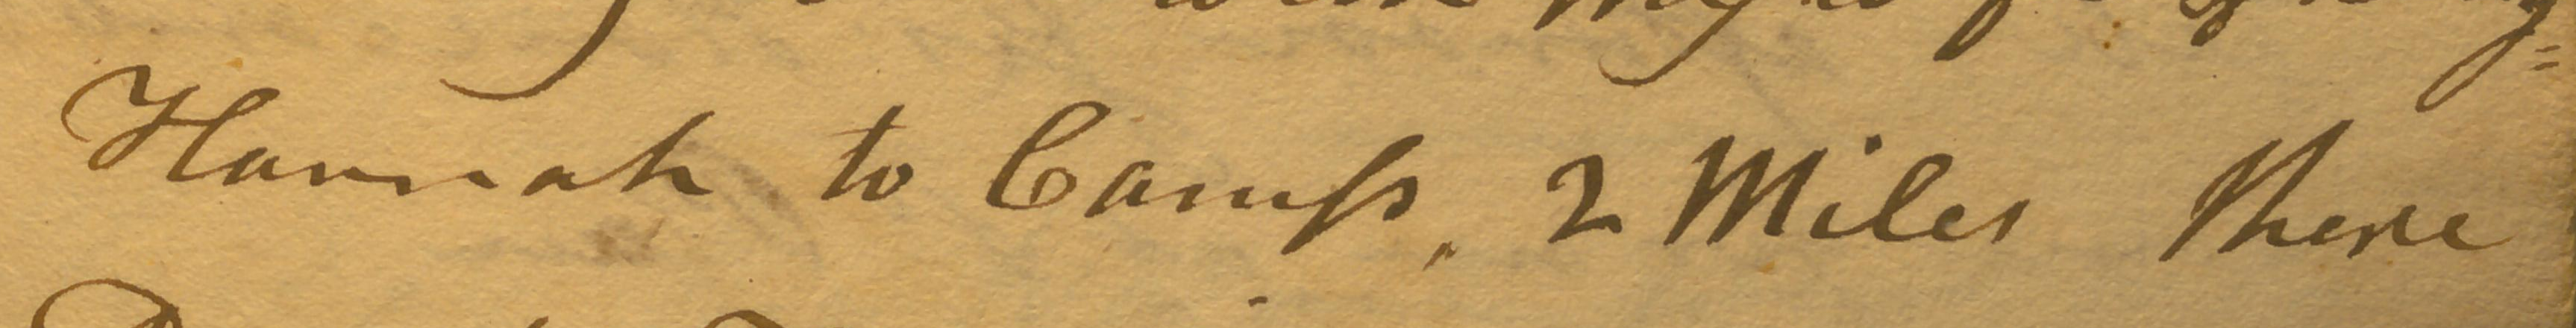Hannah to Camp 2 Miles there
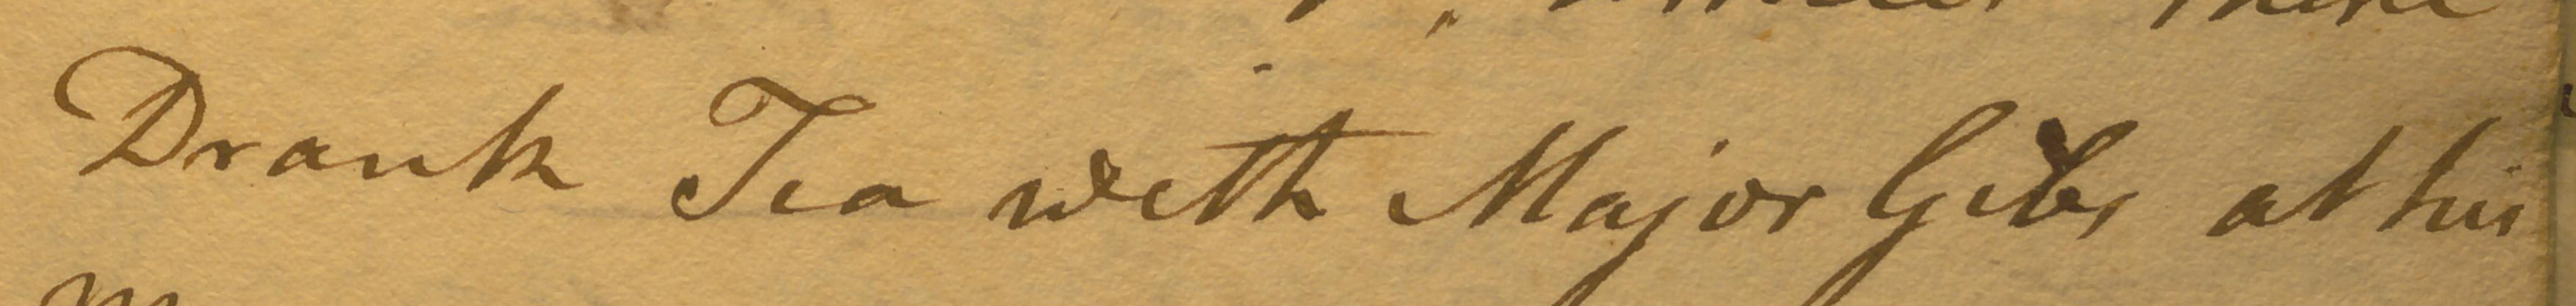Drank Tea with Major Gibs at his
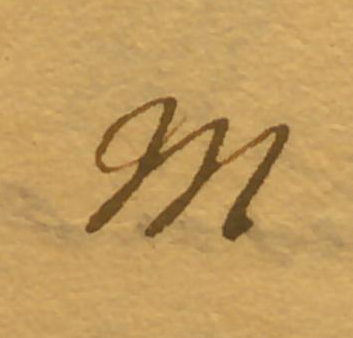M
